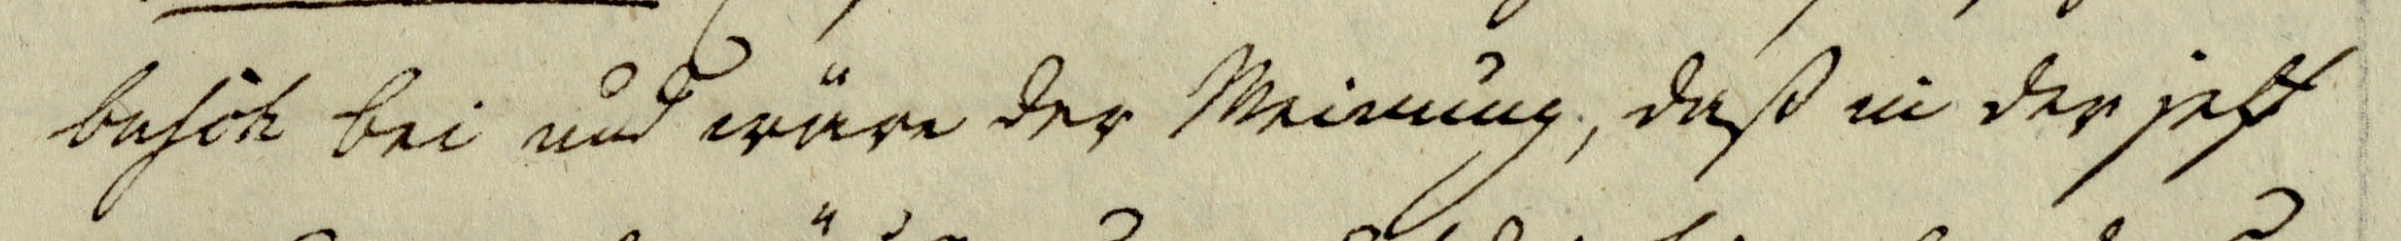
busch bei und wäre der Meinung, daß in der jetzt
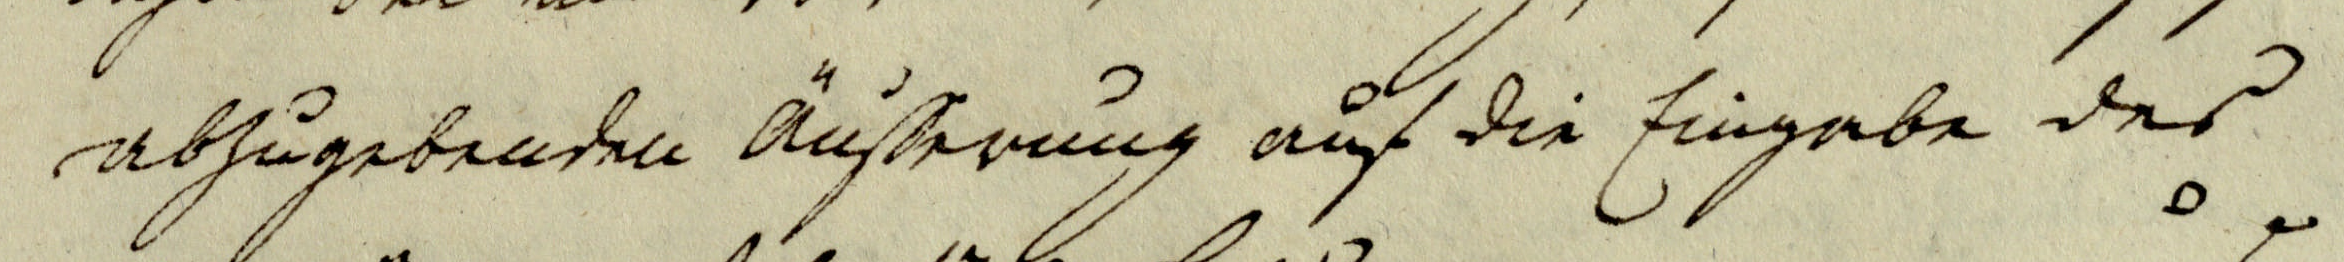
abzugebenden Äusserung auf die Eingabe des
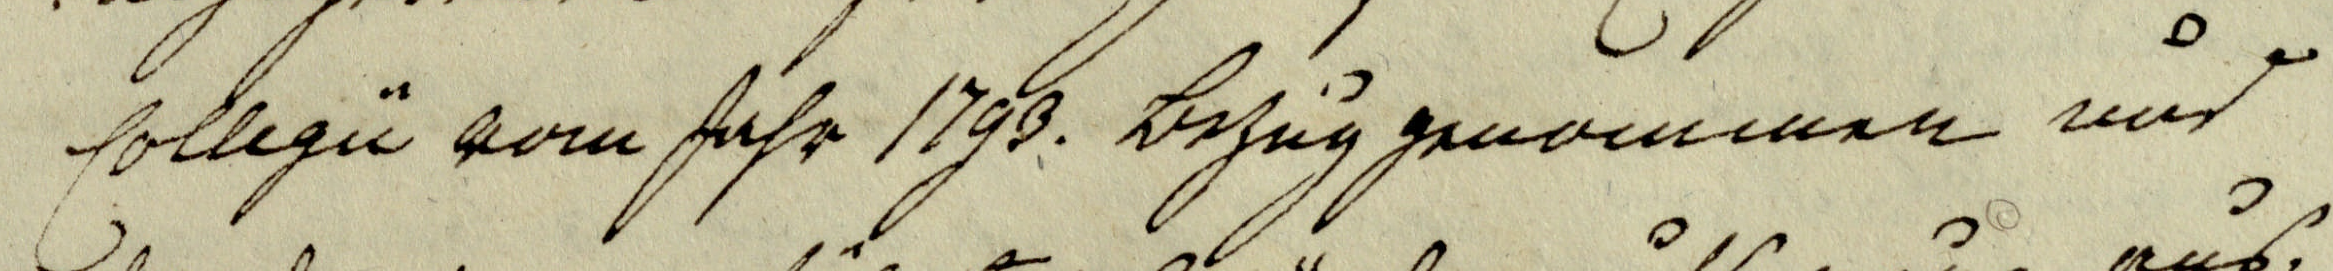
Collegii vom Jahr 1793. Bezug genommen und
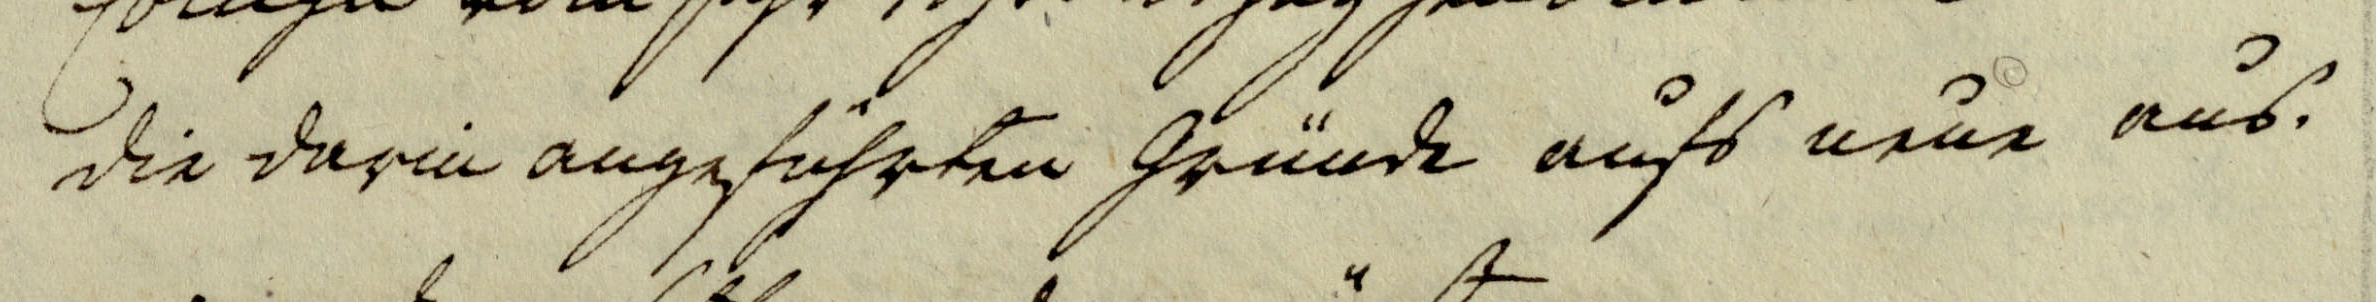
die darin angeführten Gründe aufs neue aus¬
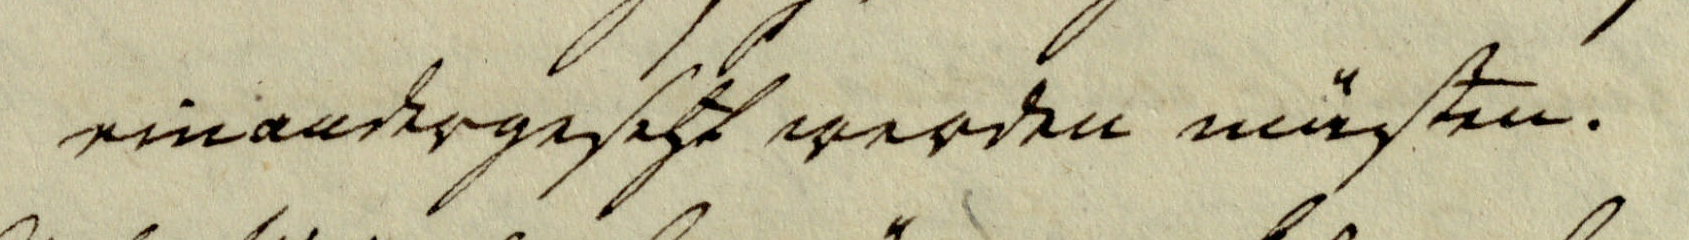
einandergesetzt werden müßten.
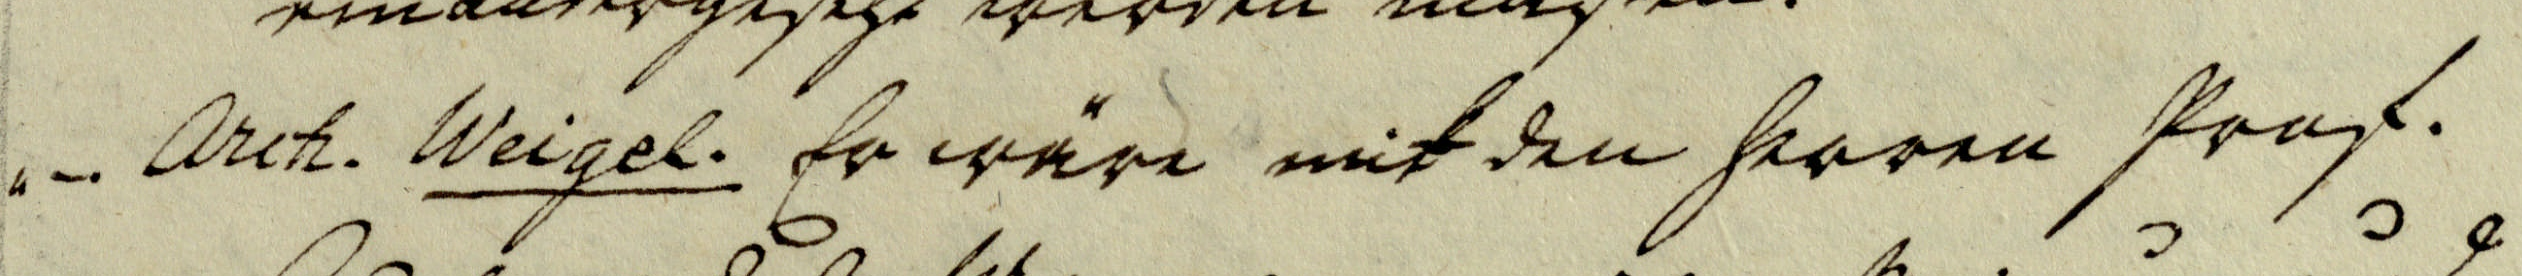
Arch. Weigel. Er wäre mit den Herren Prof.
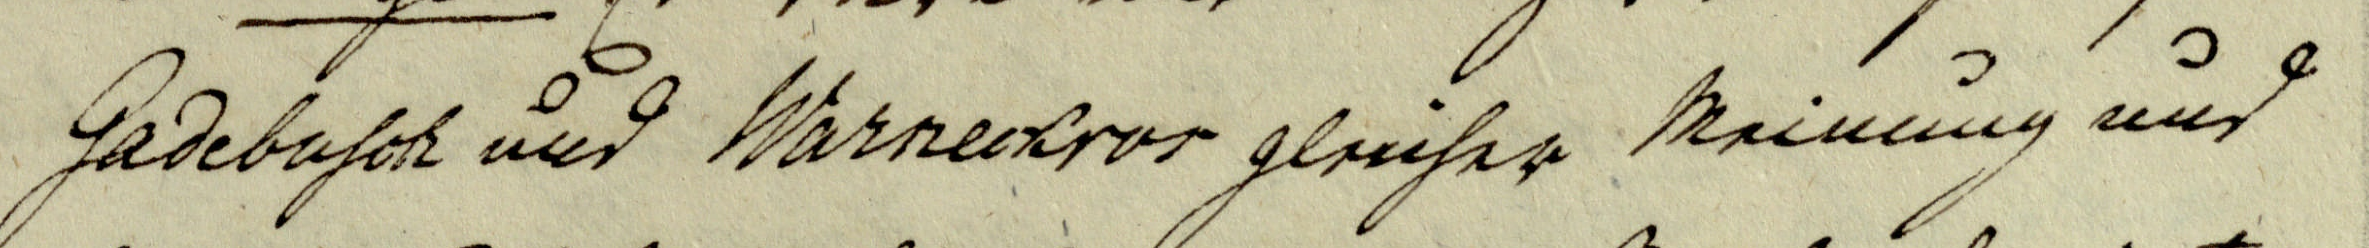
Gadebusch und Warneckros gleicher Meinung und
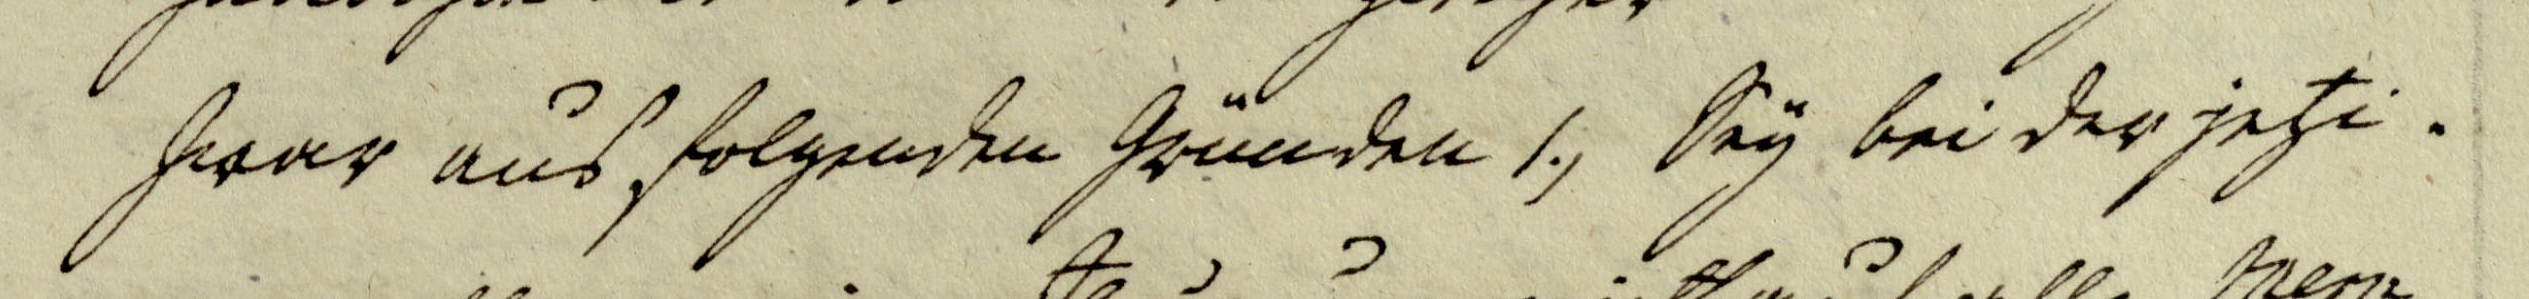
zwar aus folgenden Gründen 1., Seÿ bei der jetzi¬
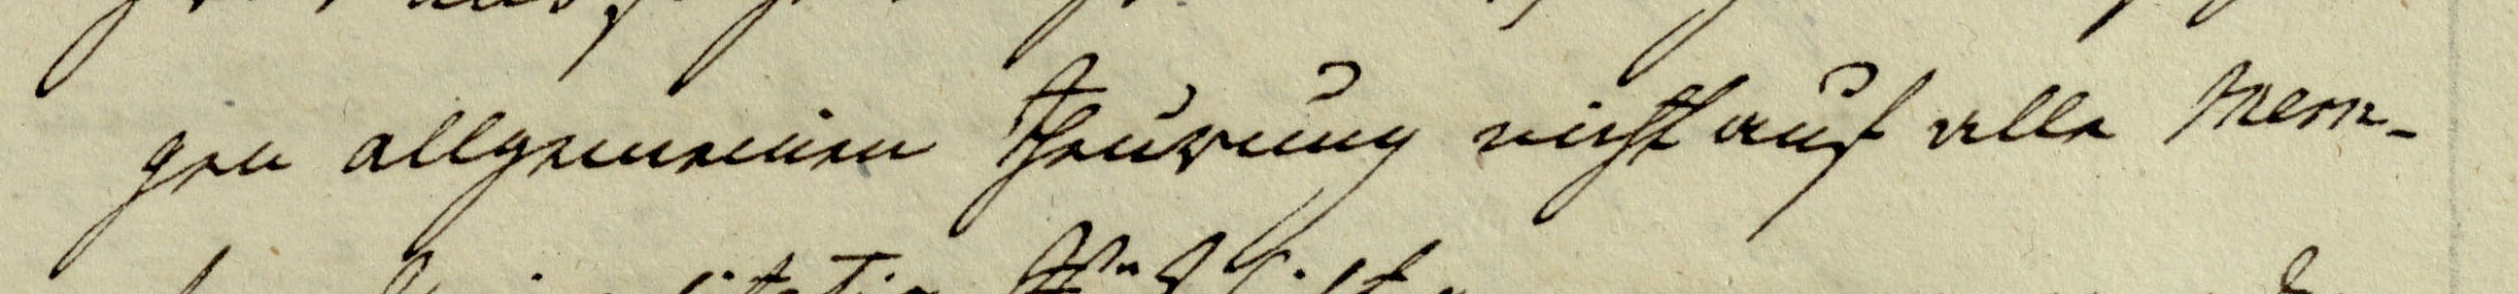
gen allgemeinen Theurung nicht auf alle Mem¬
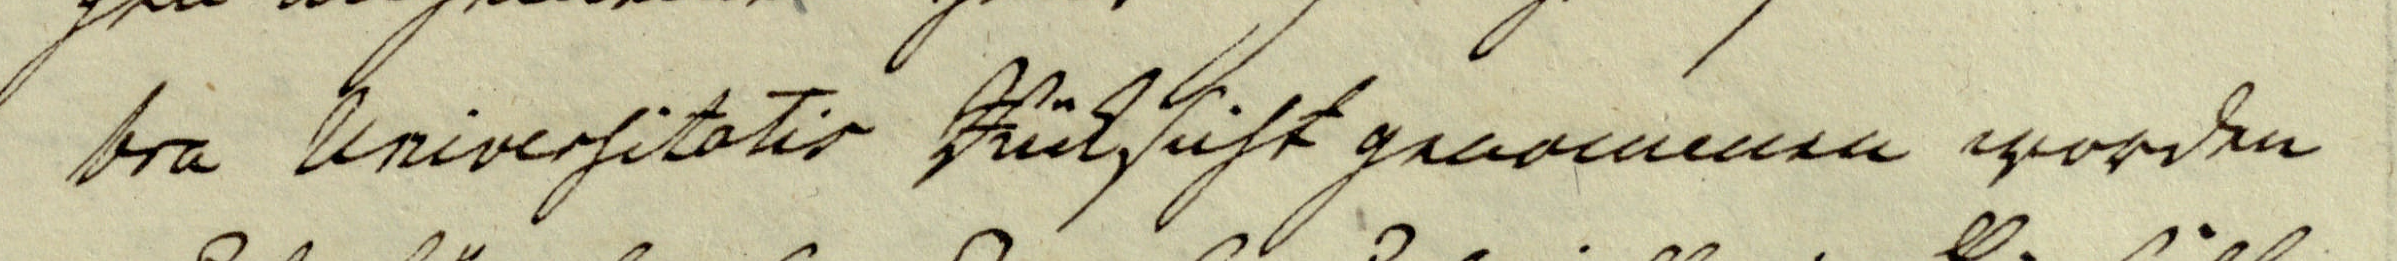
bra Universitatis Rücksicht genommen worden
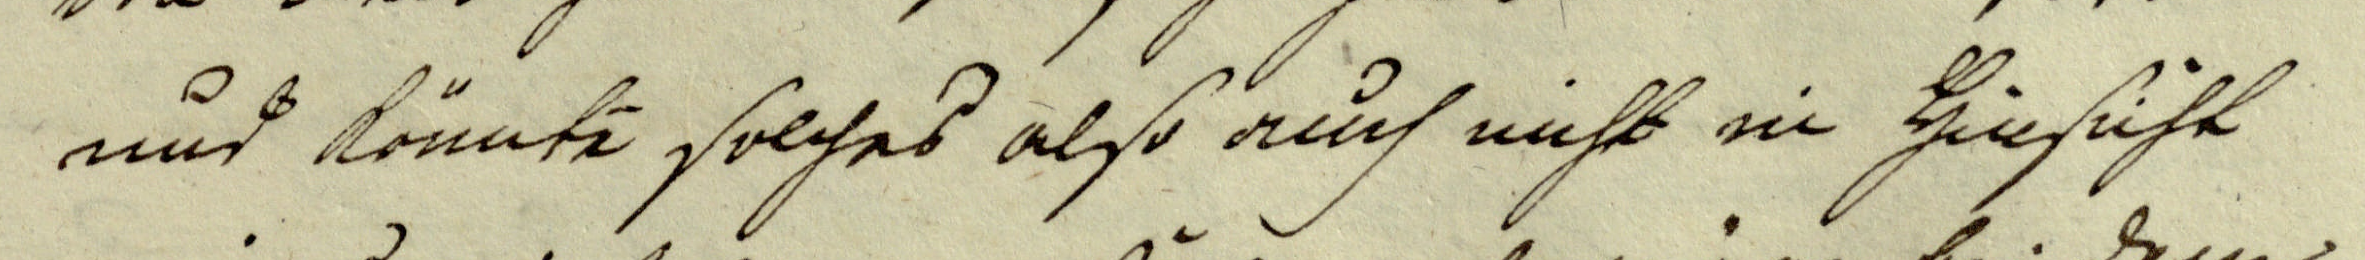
und könnte solches also auch nicht in Hinsicht
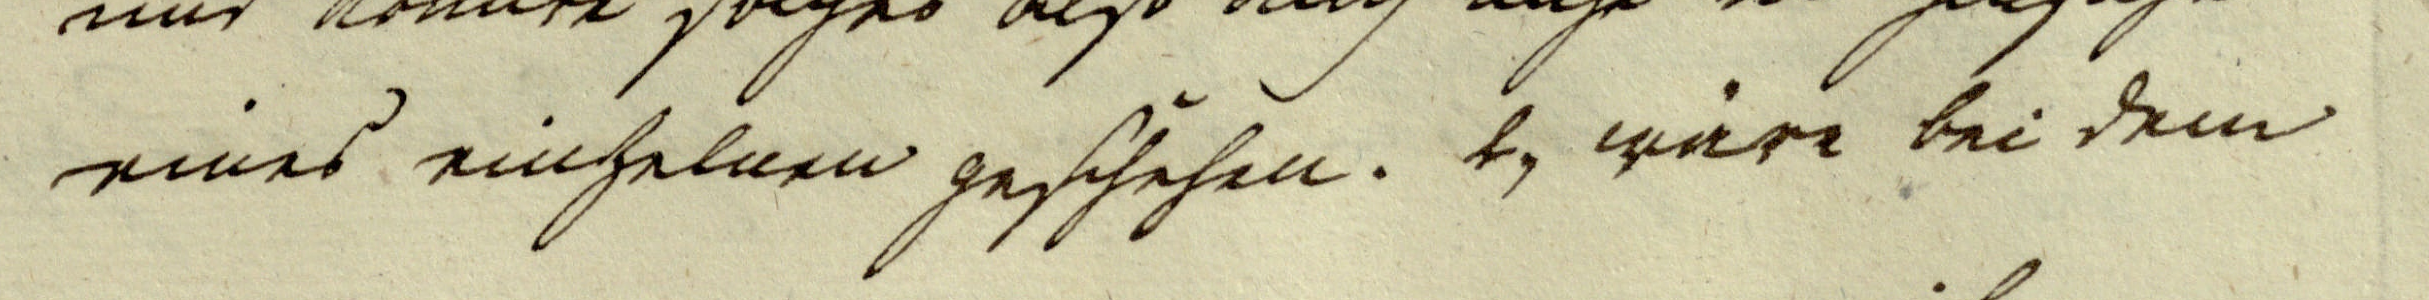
eines einzelnen geschehen. 2, wäre bei dem
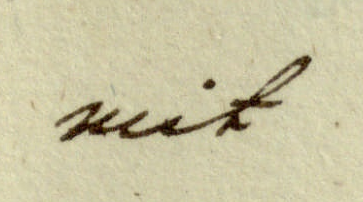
mit
